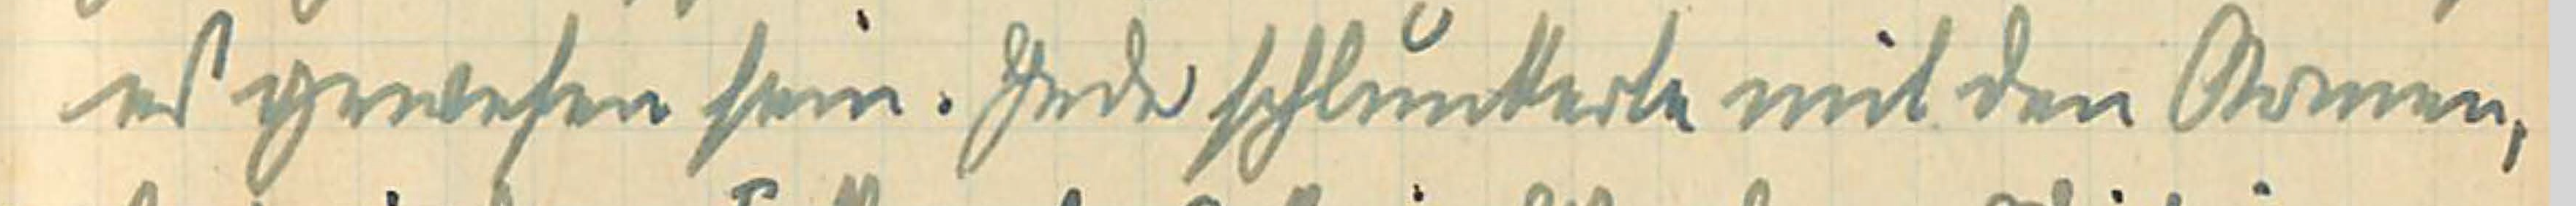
es gewesen sein. Jeder schlunkerte mit den Armen,
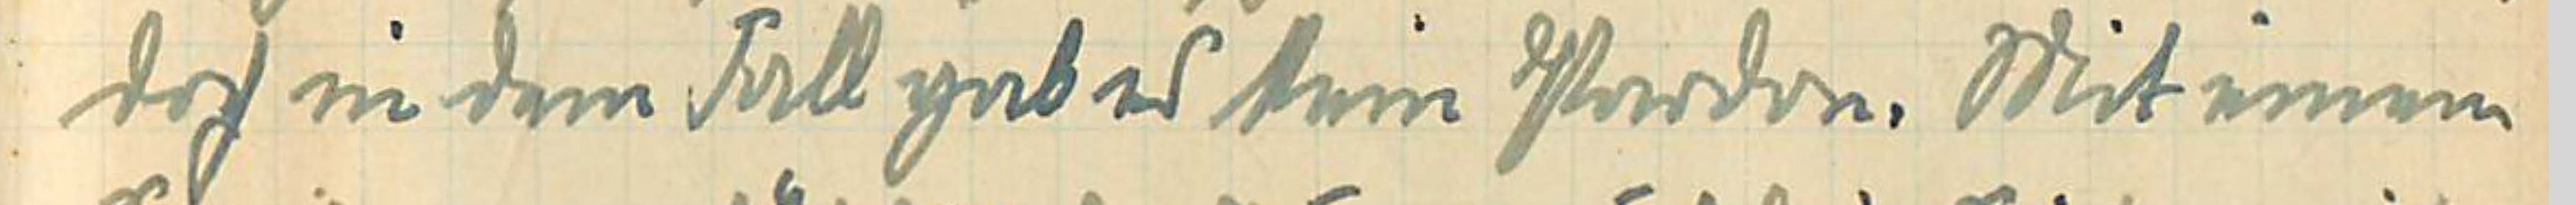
doch in dem Fall gab es kein Pardon. Mit einem
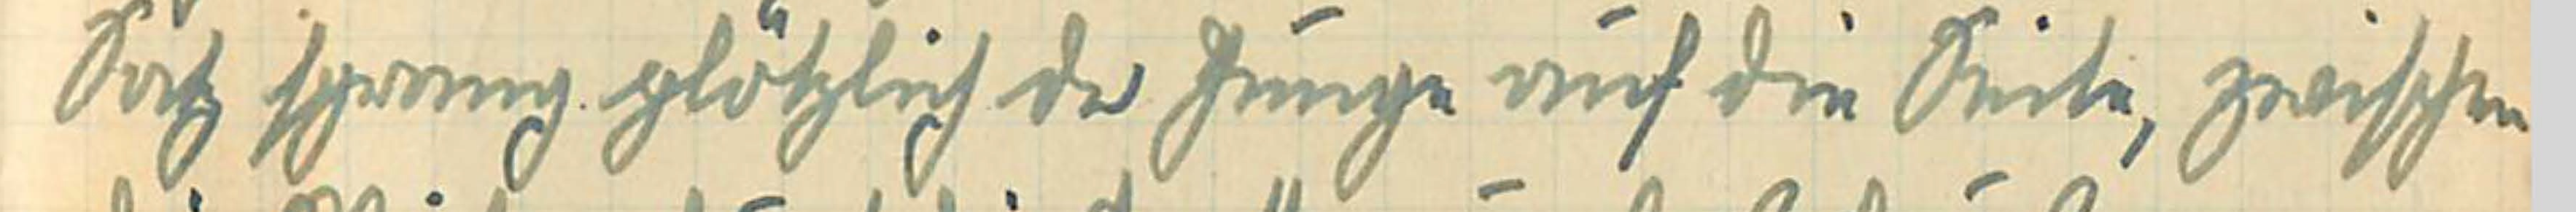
Satz sprang plötzlich der Junge auf die Seite, zwischen
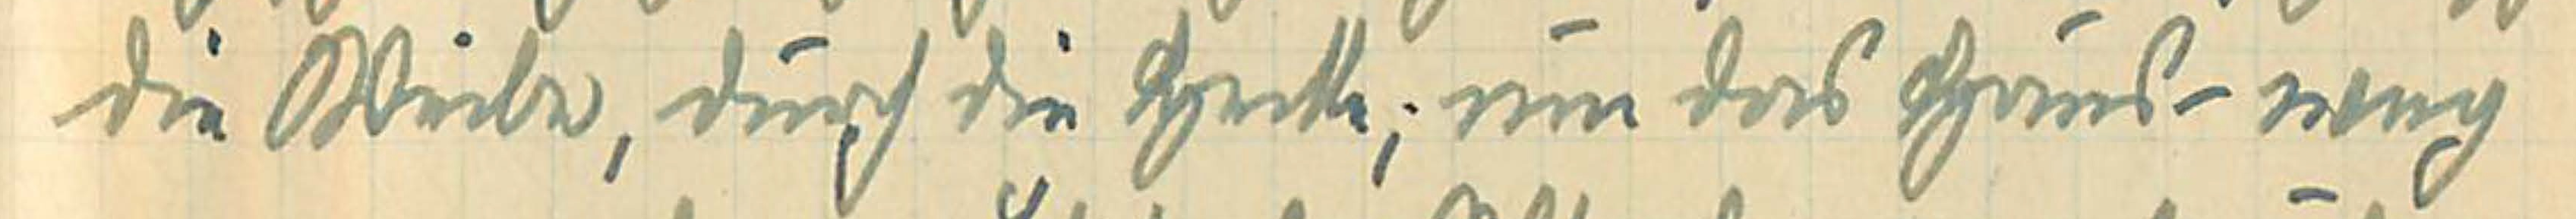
die Weiber, durch die Hecke; um das Haus – weg
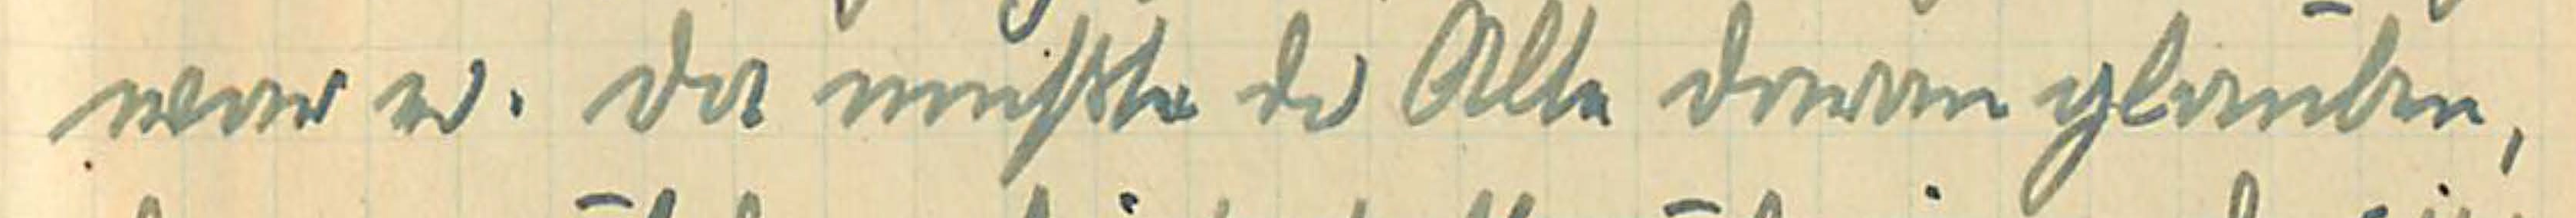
war er. Da mußte der Alte daran glauben,
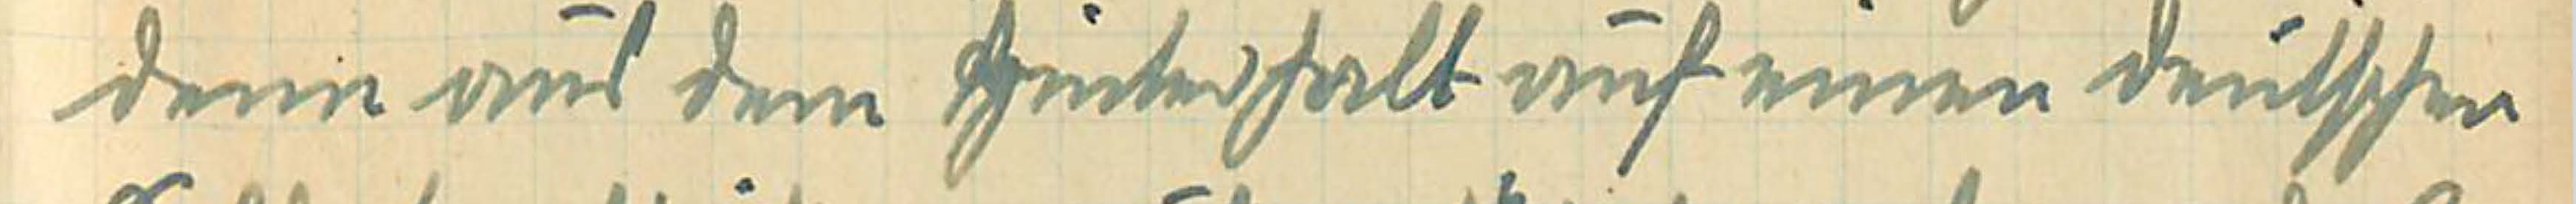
denn aus dem Hinterhalt auf einen deutschen
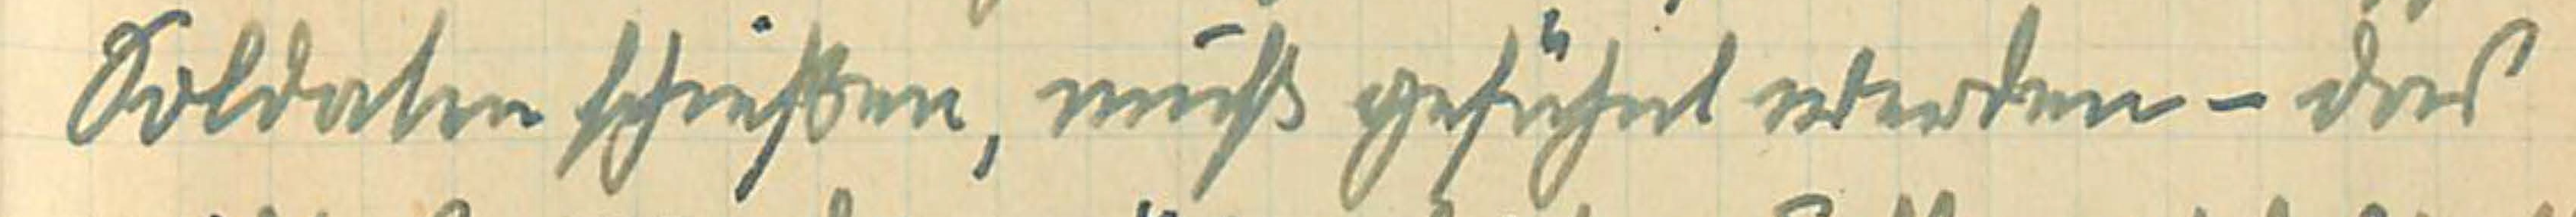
Soldaten schießen, muß gesühnt werden – das
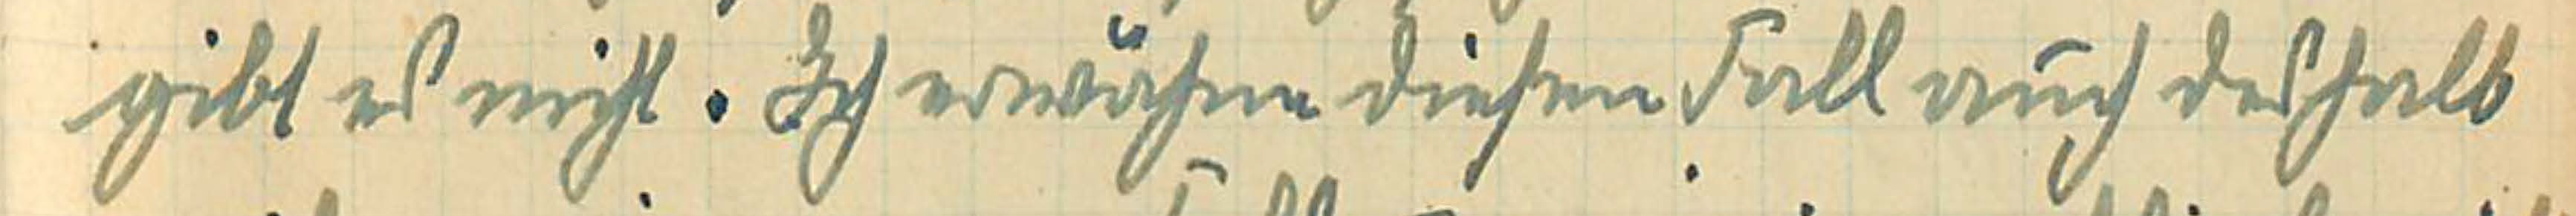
gibt es nicht. Ich erwähne diesen Fall auch deshalb
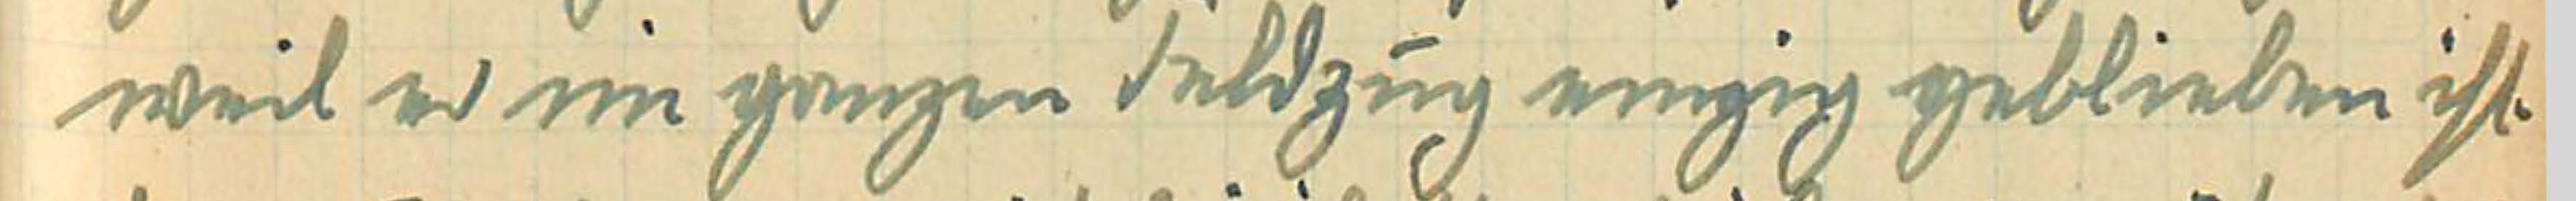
weil er im ganzen Feldzug einzig geblieben ist.
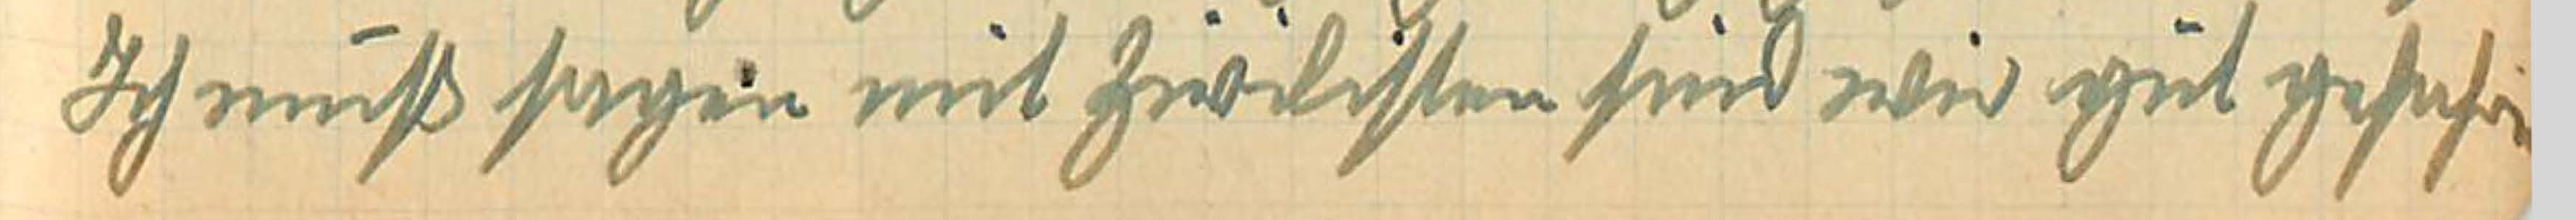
Ich muß sagen mit Zivilisten sind wir gut gefahren.
